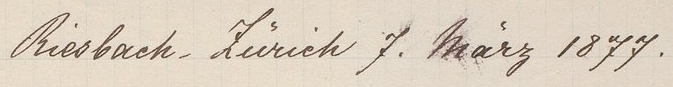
Riesbach-Zürich7. März 1877.
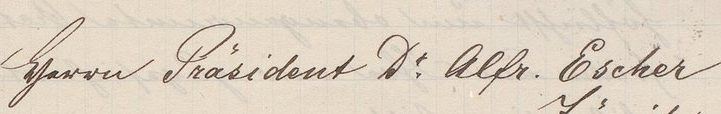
Herrn Präsident Dr Alfr. Escher
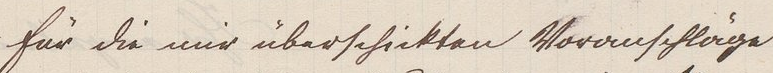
Für die mir überschickten Voranschläge
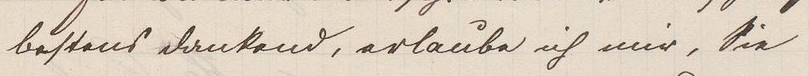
bestens dankend, erlaube ich mir, Sie
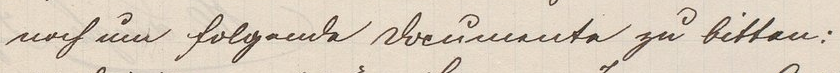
noch um folgende Documente zu bitten:
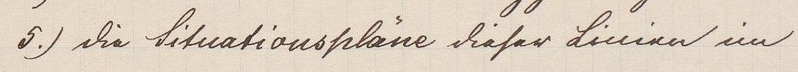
5.) Die Situationspläne dieser Linien im
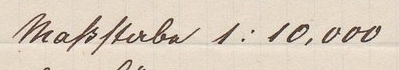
Maßstabe 1:10,000
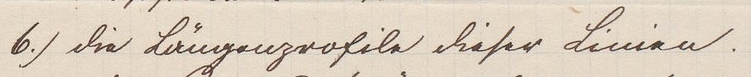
6.) Die Längenprofile dieser Linien.
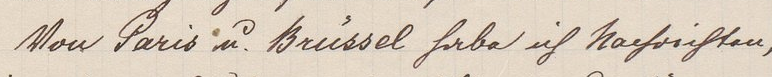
Von Paris u. Brüssel habe ich Nachrichten,
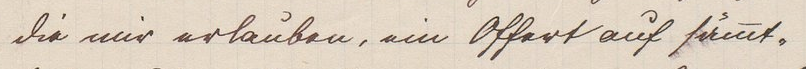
die mir erlauben, ein Offert auf sämmt-
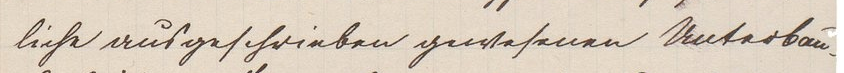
liche ausgeschrieben gewesenen Unterbau-
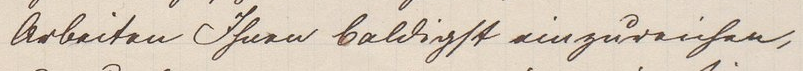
Arbeiten Ihnen baldigst einzureichen,
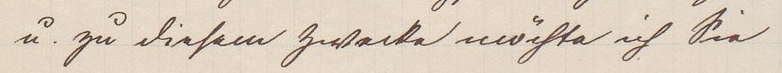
u. zu diesem Zwecke möchte ich Sie
